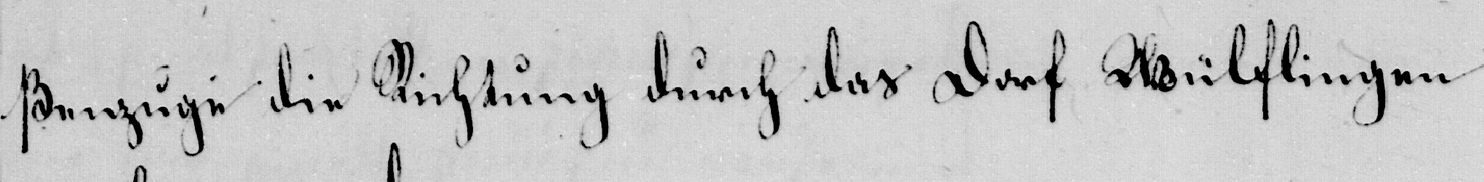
ßenzuge die Richtung durch das Dorf Wülflingen
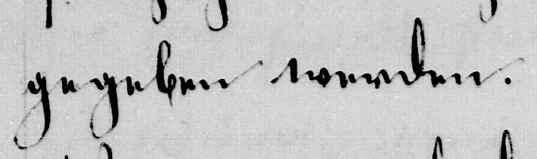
gegeben werden.
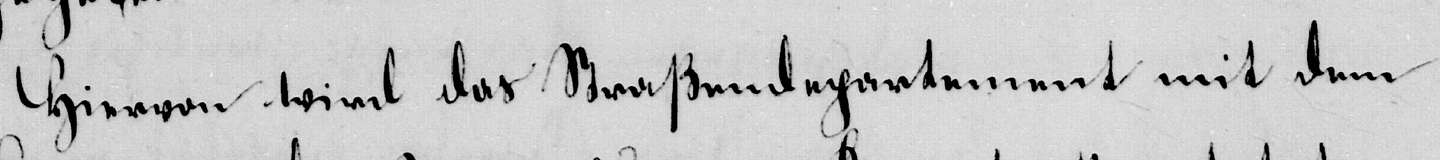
Hiervon wird das Straßendepartement mit dem
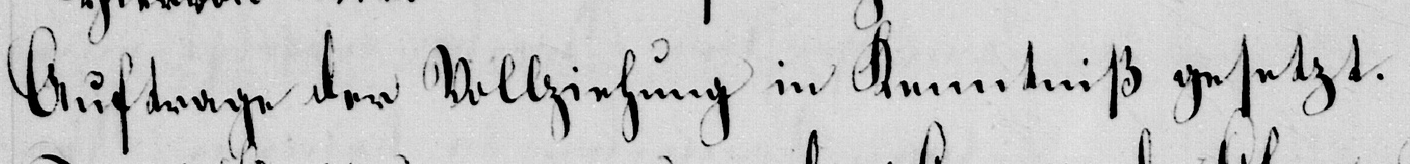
Auftrage der Vollziehung in Kenntniß gesetzt.
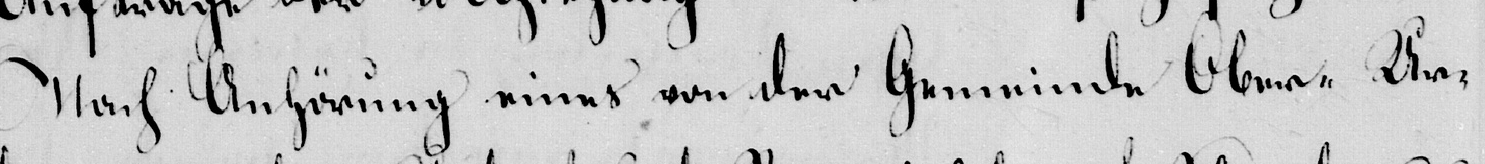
Nach Anhörung eines von der Gemeinde Ober-Ur¬
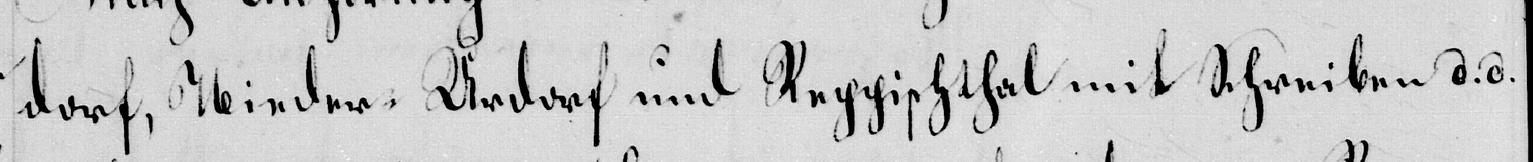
dorf, Nieder-Urdorf und Reppischthal mit Schreiben d. d.
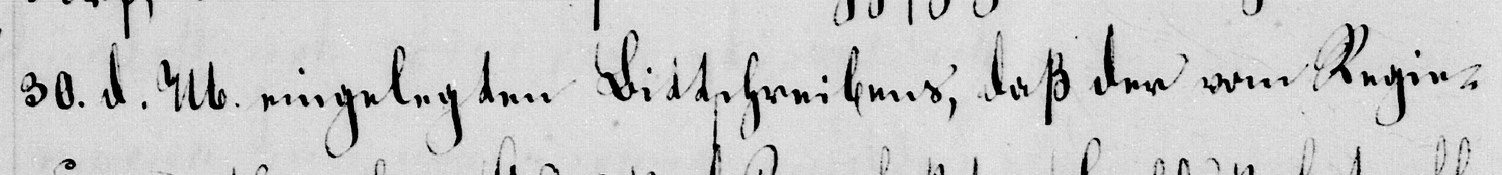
30. d. M. eingelegten Bittschreibens, daß der vom Regie¬
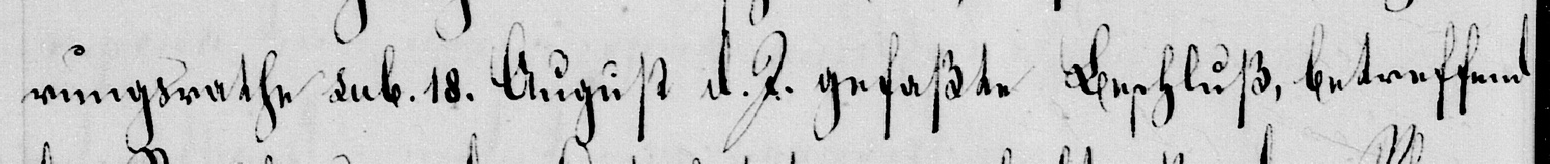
rungsrathe sub. 18. August d. J. gefaßte Beschluß, betreffend
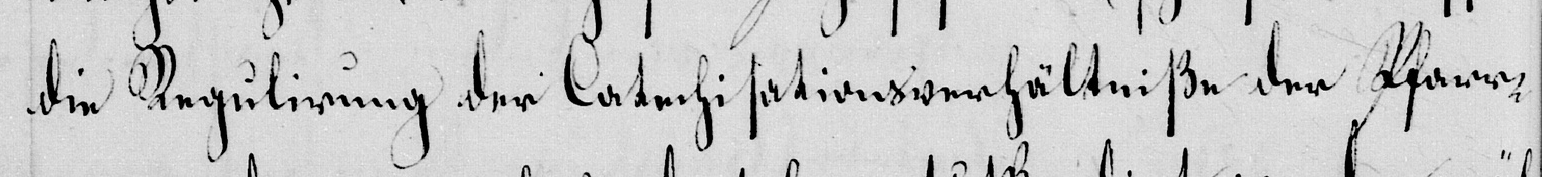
die Regulirung der Catechisationsverhältniße der Pfarr¬
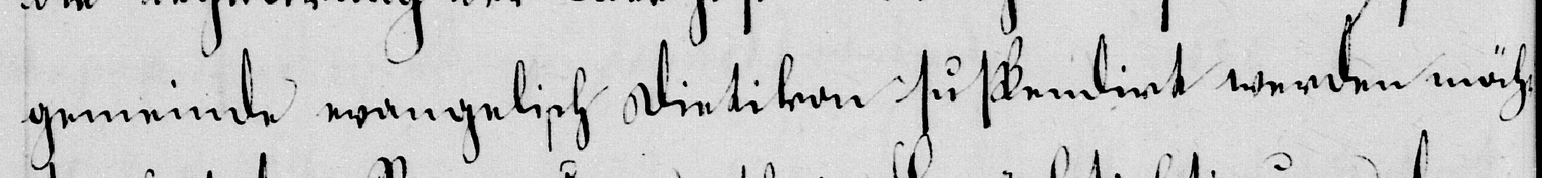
gemeinde evangelisch Dietikon suspendirt werden möch¬
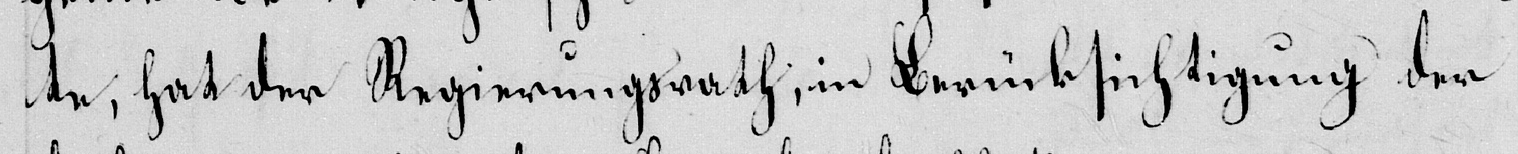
ten, hat der Regierungsrath, in Berücksichtigung der
